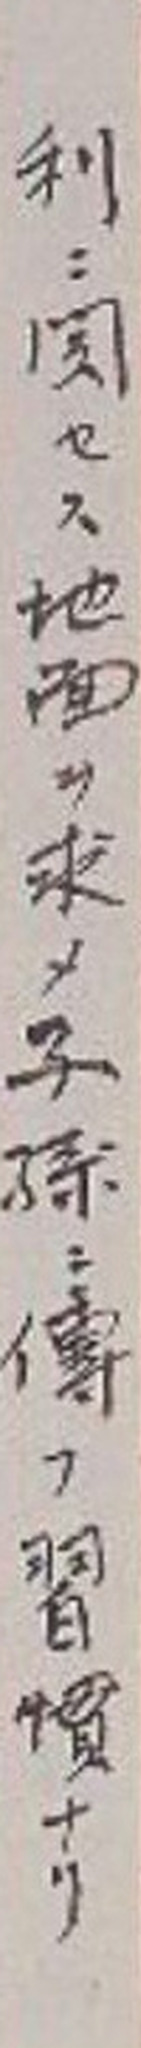利ニ関セス地面ヲ求メ子孫ニ伝フ習慣ナリ
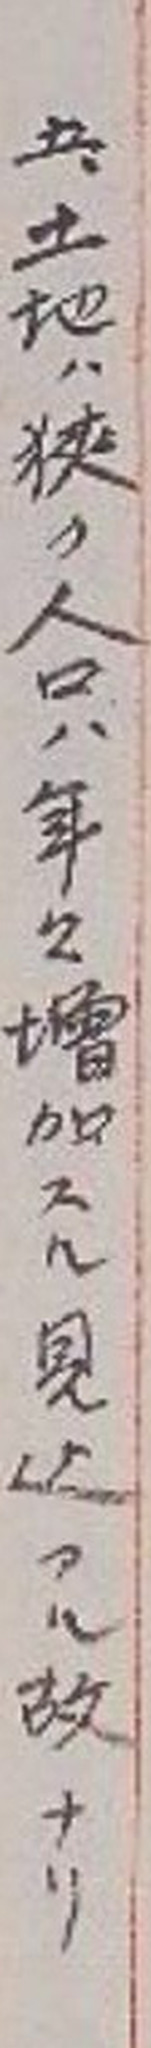五、土地ハ狭ク人口ハ年々増加スル見込アル故ナリ
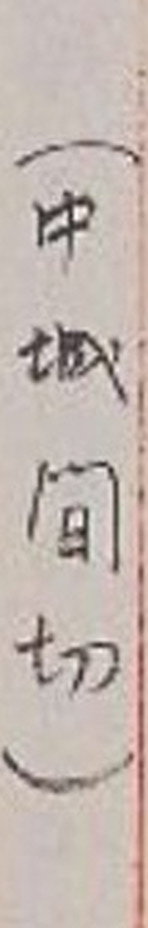(中城間切)
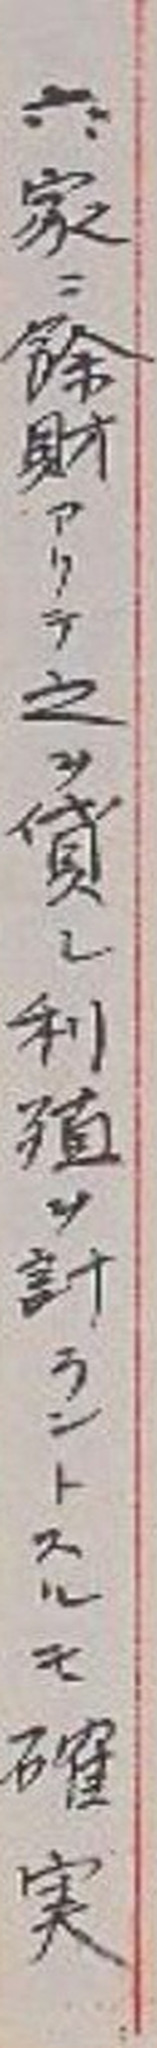六、家ニ余財アリテ之ヲ貸シ利殖ヲ計ラントスルモ確実
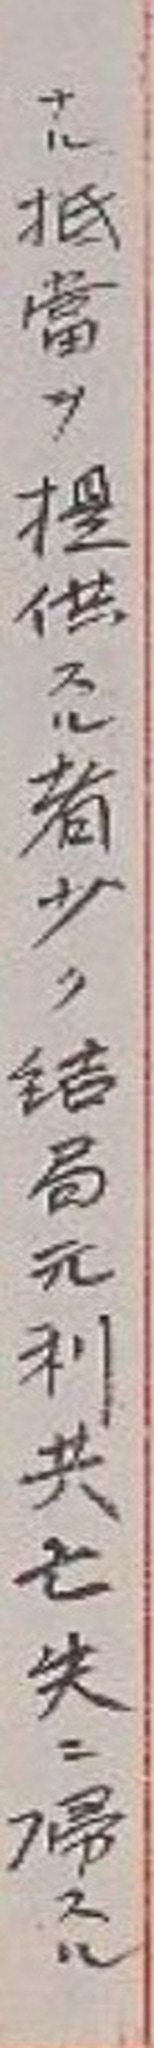ナル抵当ヲ提供スル者少ク結局元利共亡失ニ帰スル

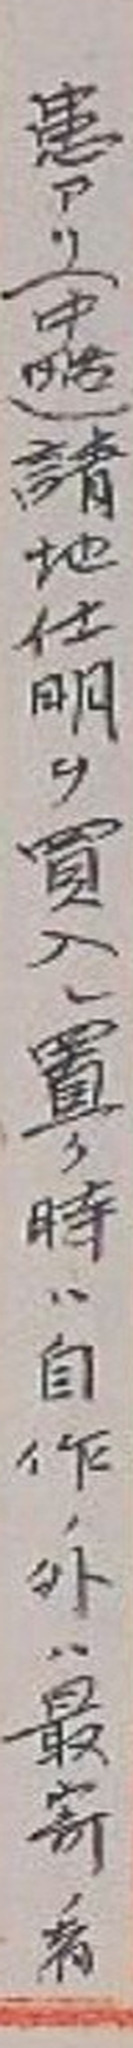患アリ(中略)請地仕明ヲ買入レ置ク時ハ自作ノ外ハ最寄ノ者
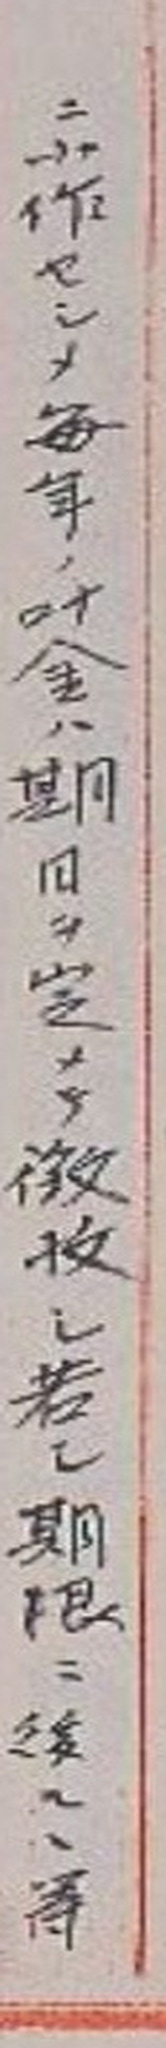ニ小作セシメ毎年ノ叶金ハ期日ヲ定メテ徴収シ若シ期限ニ後ルヽ等
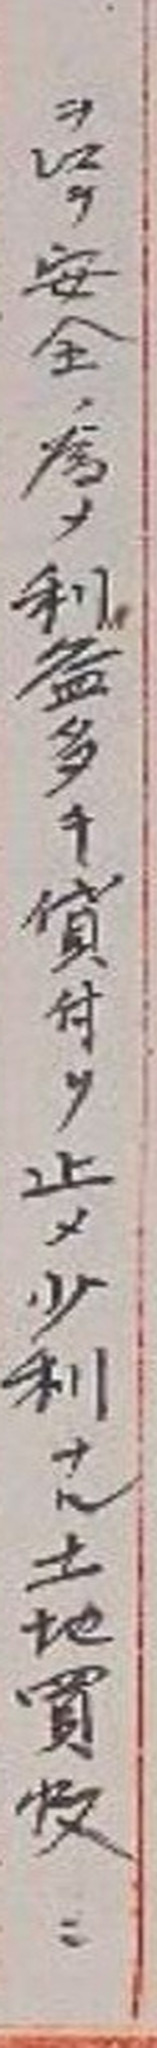ヲ以テ安全ノ為メ利益多キ貸付ヲ止メ少利ナル土地買収ニ
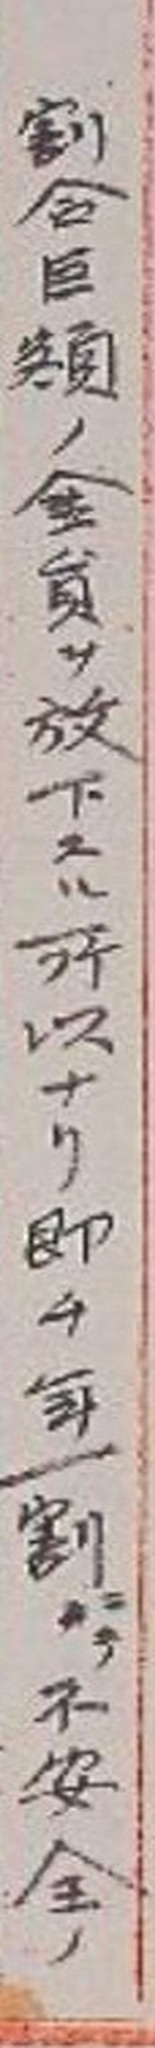割合巨額ノ金員ヲ放下スル所以ナリ即チ年一割ニテ不安全ノ
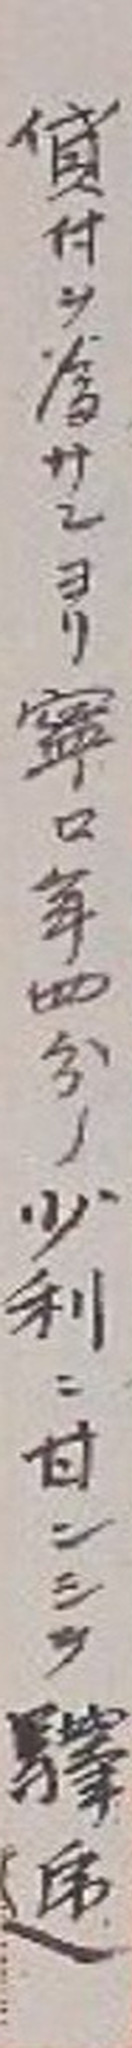貸付ヲ為サンヨリ寧ロ年四分ノ少利ニ甘ンシテ駅逓
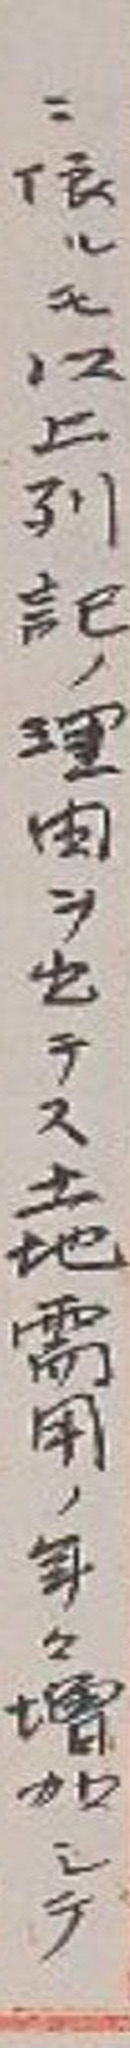ニ限ルモ以上列記ノ理由ヲ出テス土地需用ノ年々増加シテ
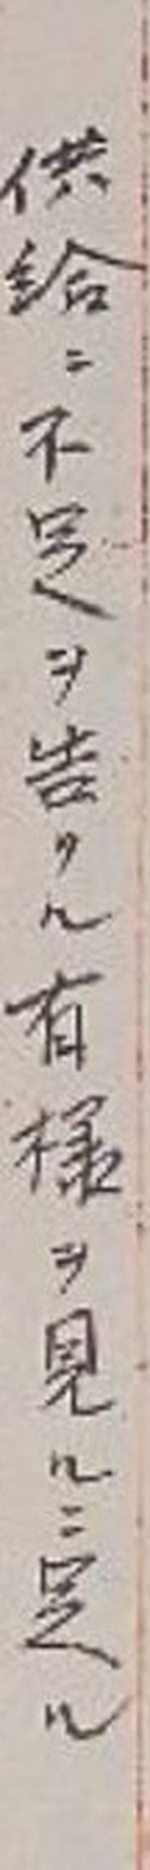供給ニ不足ヲ告クル有様ヲ見ルニ足ル
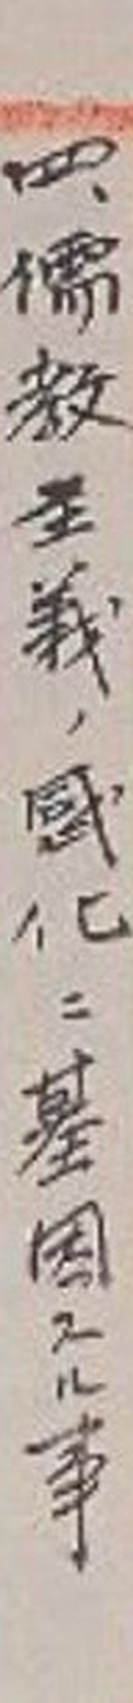四、儒教主義ノ感化ニ基因スル事
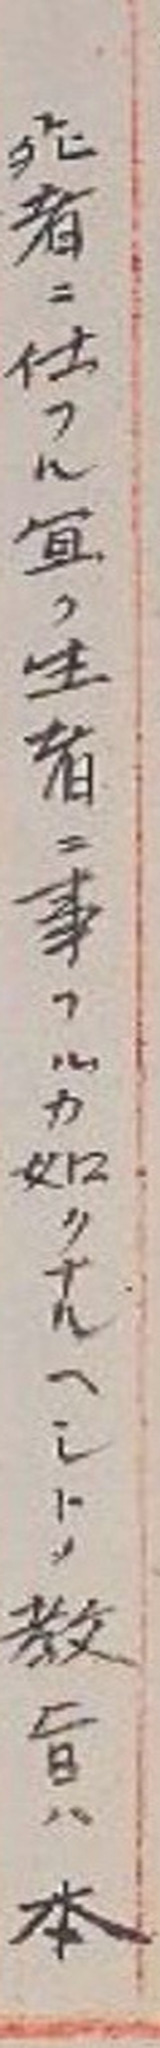死者ニ仕フル宜ク生者ニ事フルカ如クナルヘシトノ教旨ハ本
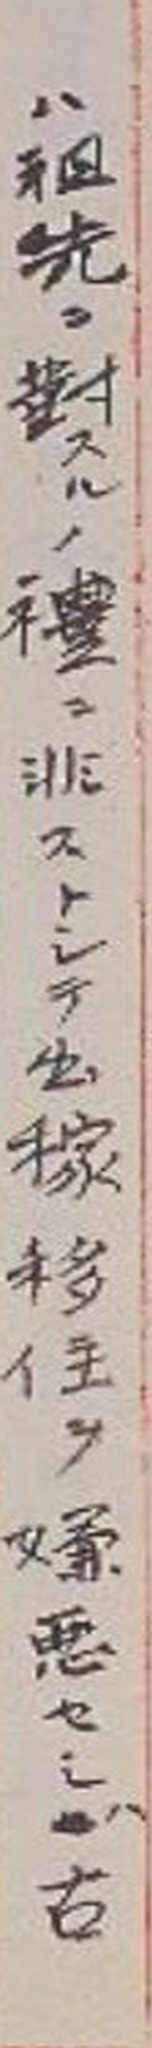ハ祖先ニ対スルノ礼ニ非ストシテ出稼移住ヲ嫌悪セシハ古
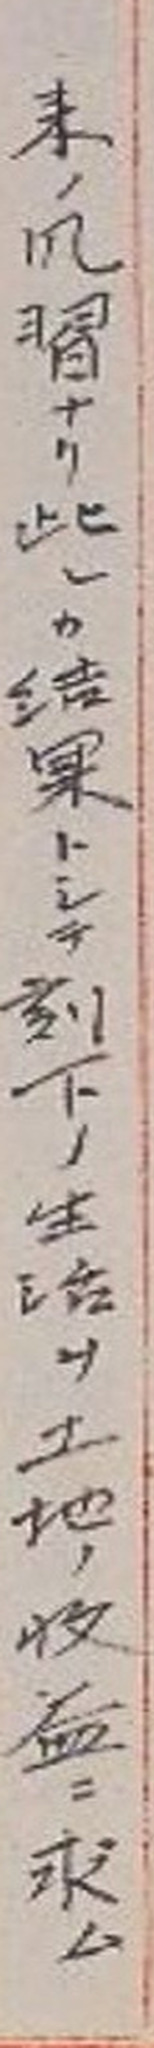来ノ風習ナリ此レカ結果トシテ刻下ノ生活ヲ土地ノ収益ニ求ム
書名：本県地価ノ高キ理由調書
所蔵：University of the Ryukyus Library
